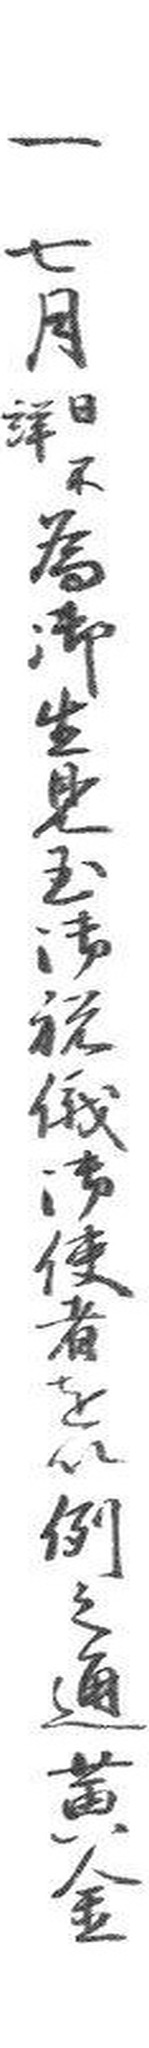一七月日不詳為御生見玉御祝儀御使者を以例之通黄金
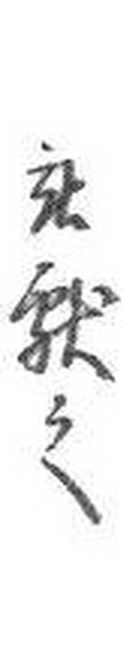被献之
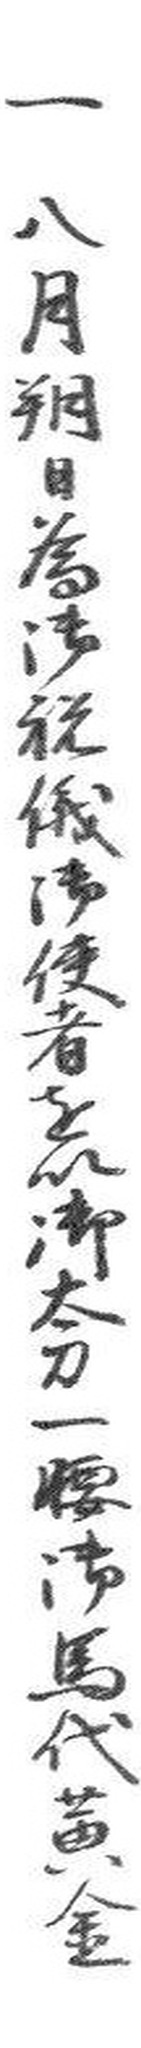一八月朔日為御祝儀御使者を以御太刀一腰御馬代黄金
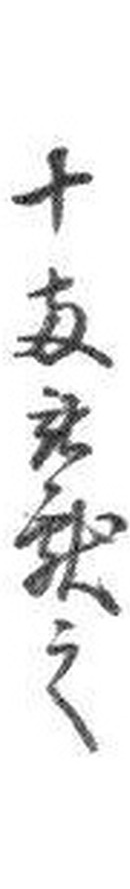十両被献之
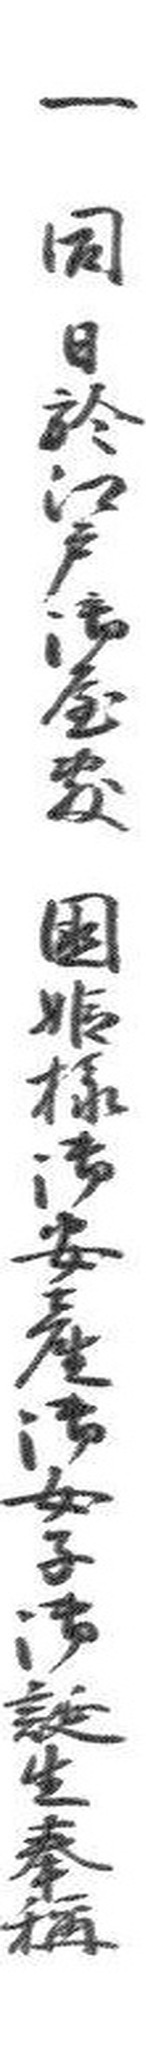一同日於江戸表御屋敷国姫様御安産御女子御誕生奉称
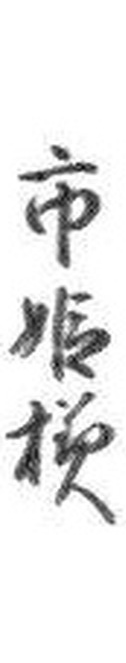市姫様
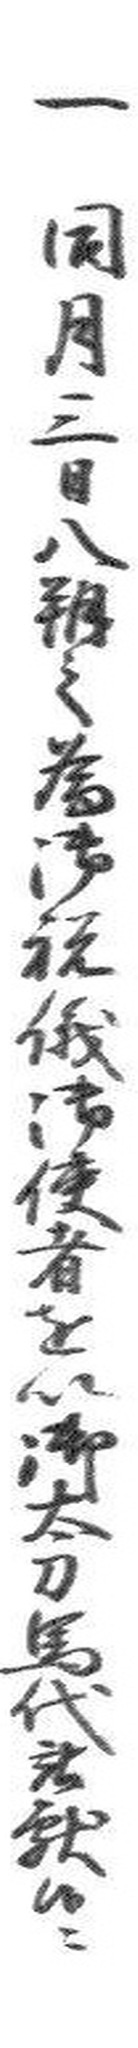一同月三月八朔之為御祝儀御使者を以御太刀馬代被献候二
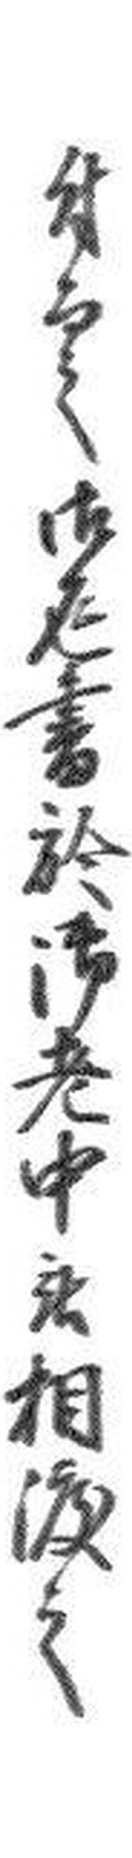付而之御返書於御老中被相渡之
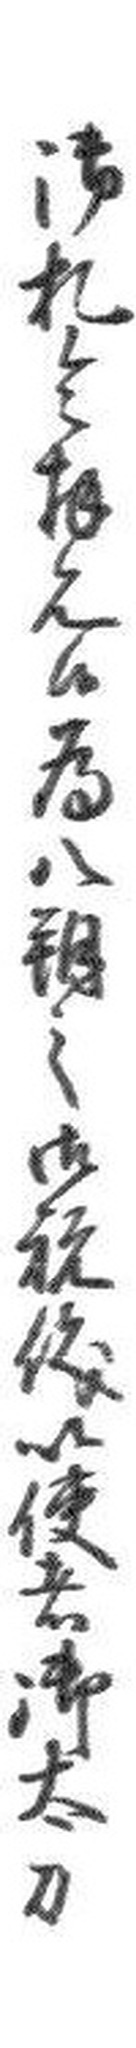御札令拝見候為八朔之御祝儀以使者御太刀
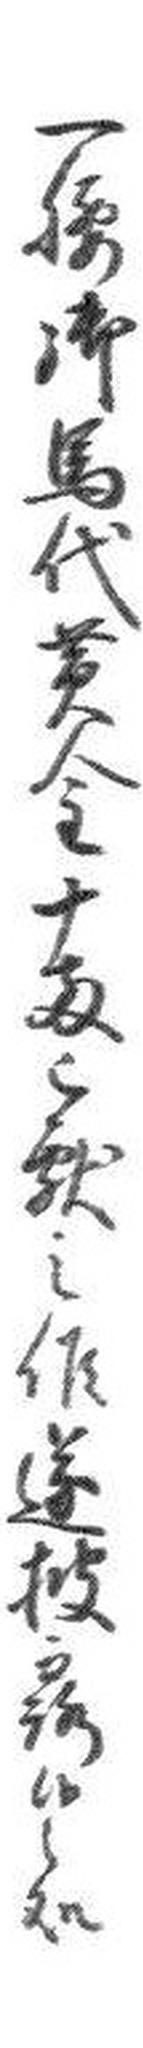一腰御馬代黄金十両被献之候遂披露候之処
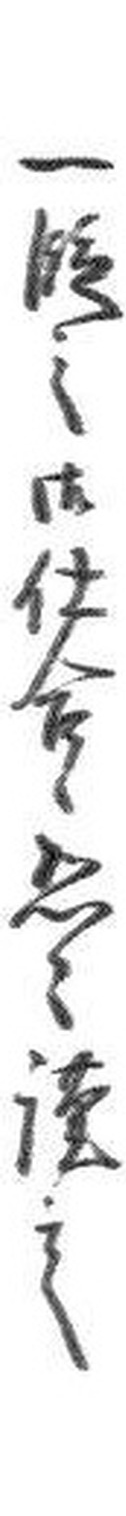一段之御仕合候恐々謹言
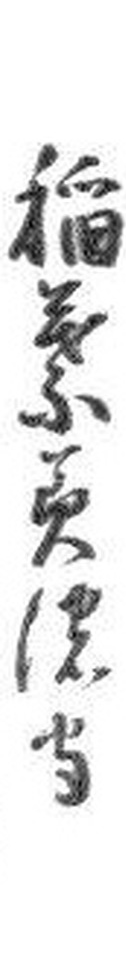稲葉美濃守
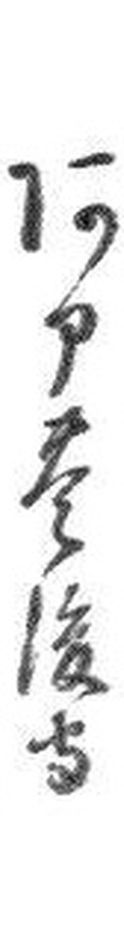阿部豊後守
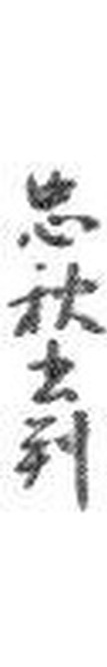忠秋書判

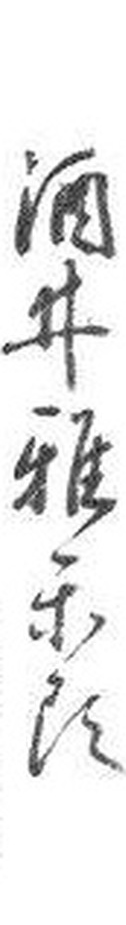酒井雅楽頭
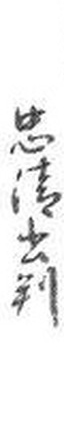忠清書判
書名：家譜 五 光通公 従寛永十三年到万治二年
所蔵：福井県文書館 Fukui Prefectural Archives
